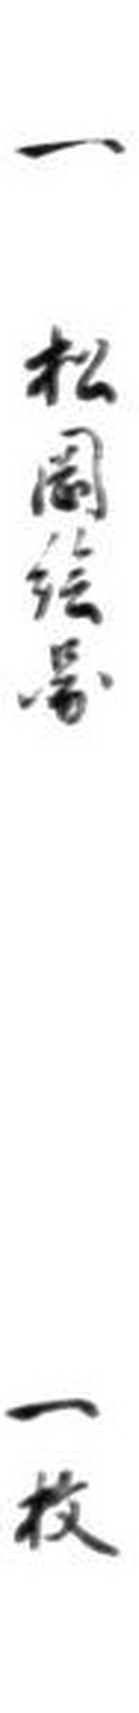一松岡絵図一枚
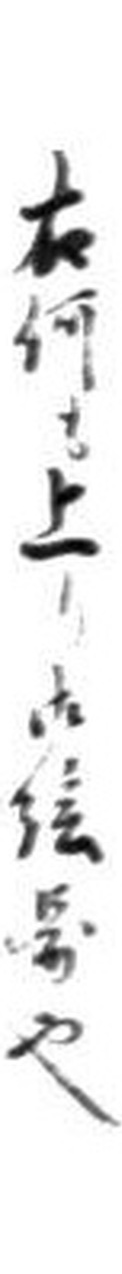右何も上り御絵図也

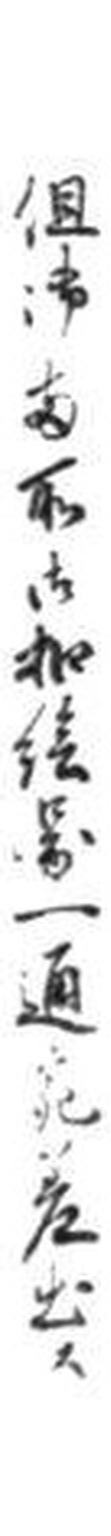但御両所御扣絵図一通宛差出ス
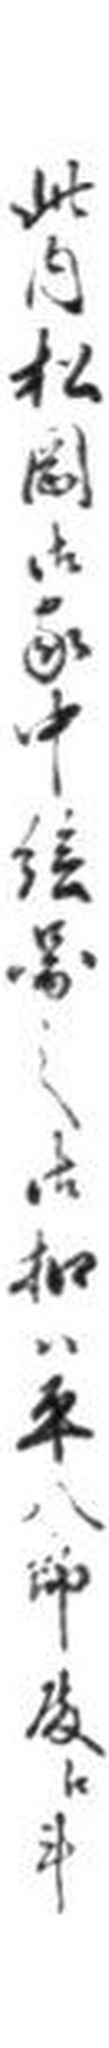此内松岡御家中絵図之御扣ハ平八郎殿江斗
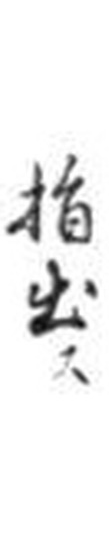指出ス
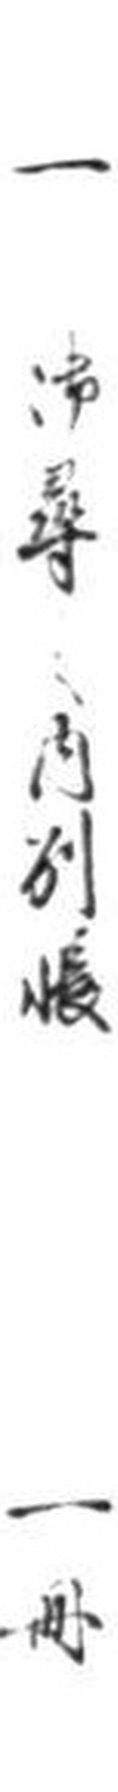一御尋之内別帳一冊
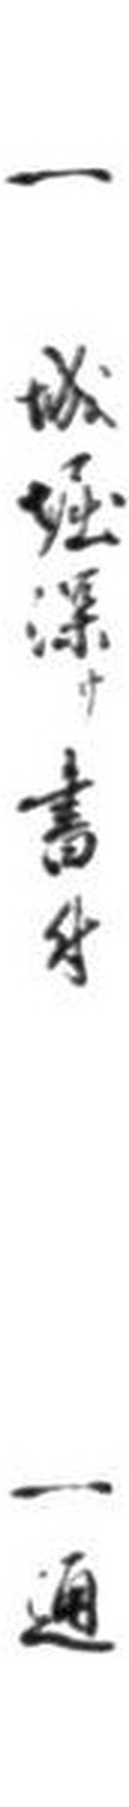一城堀深サ書付一通
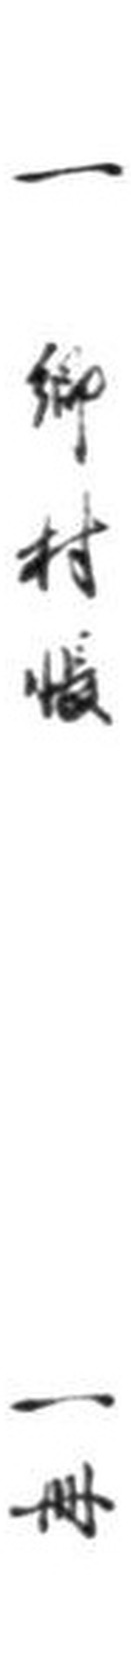一郷村帳一冊
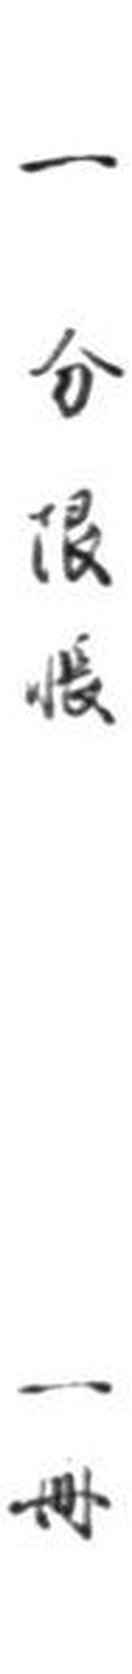一分限帳一冊
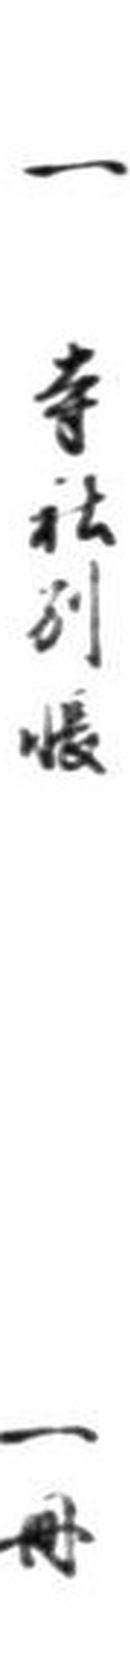一寺社別帳一冊
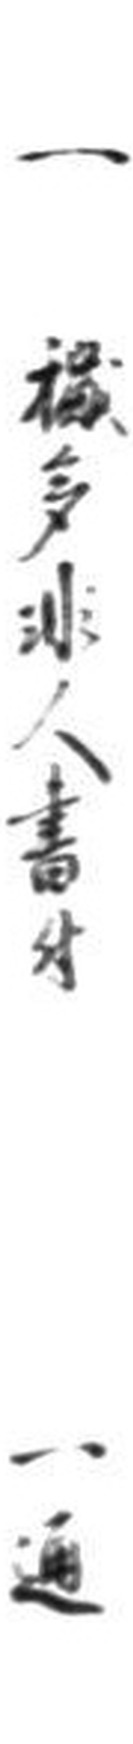一穢多非人書付一通
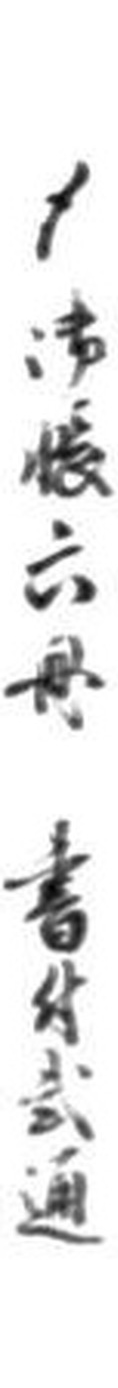〆御帳六冊書付弐通
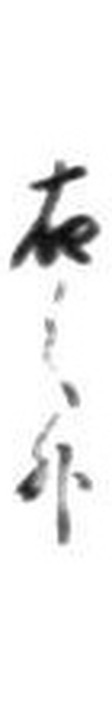右之外
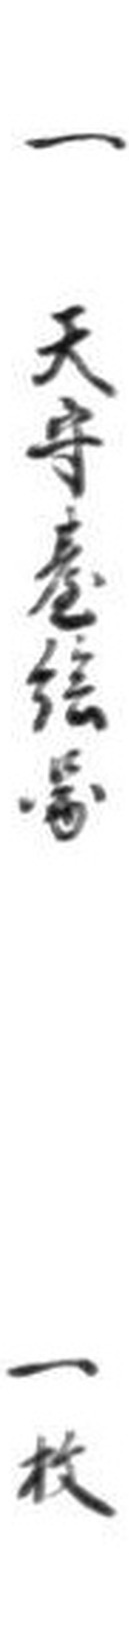一天守台絵図一枚
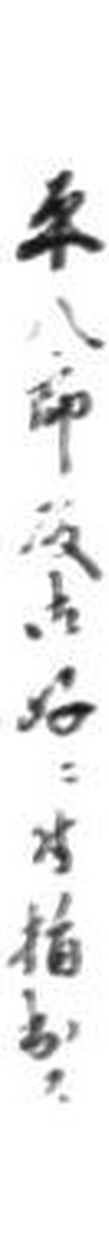平八郎殿御好ニ付指出ス
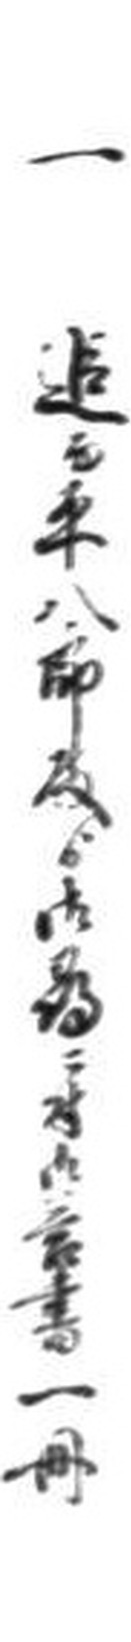一追而平八郎殿ゟ御尋ニ付御答書一冊
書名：家譜 三十九 宗矩公 享保十年
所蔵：福井県文書館 Fukui Prefectural Archives
